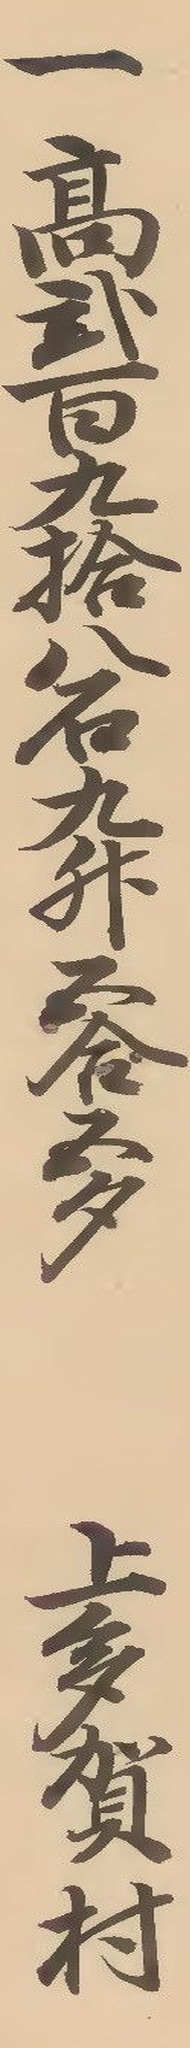一高弐百九拾八石九升五合五勺上多賀村

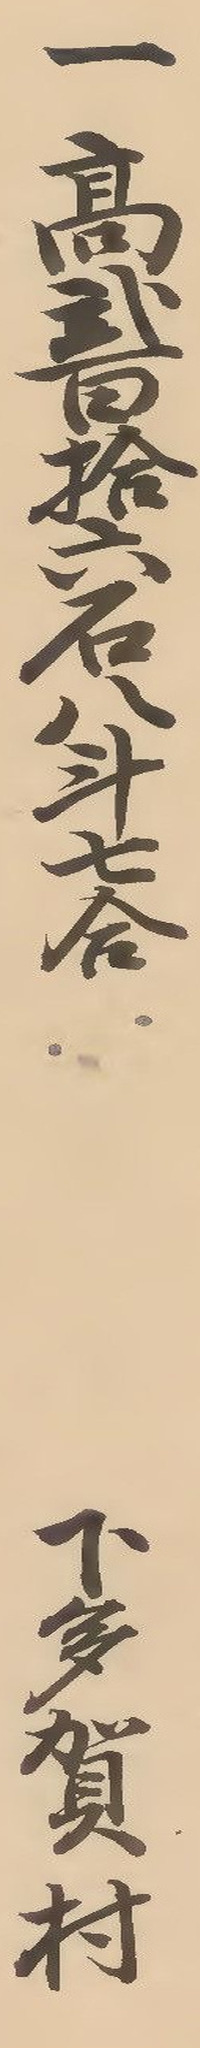一高弐百拾六石八斗七合下多賀村
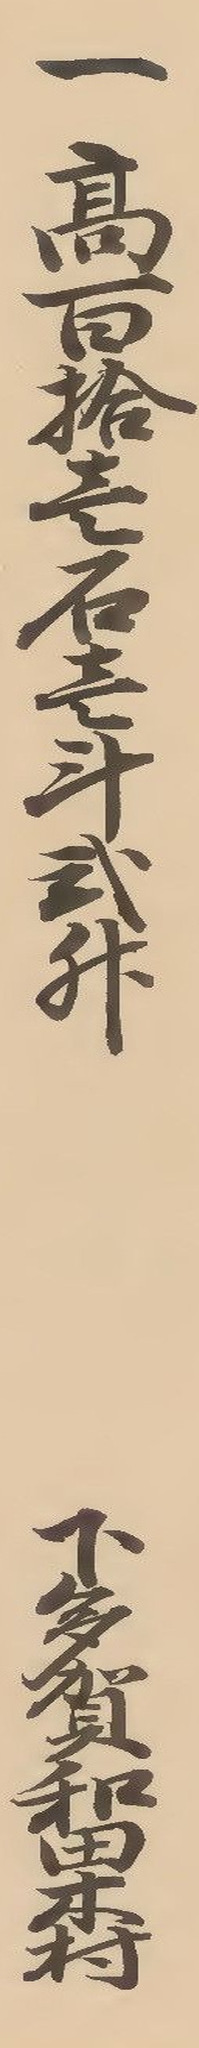一高百拾壱石壱斗弐升下多賀和田木村
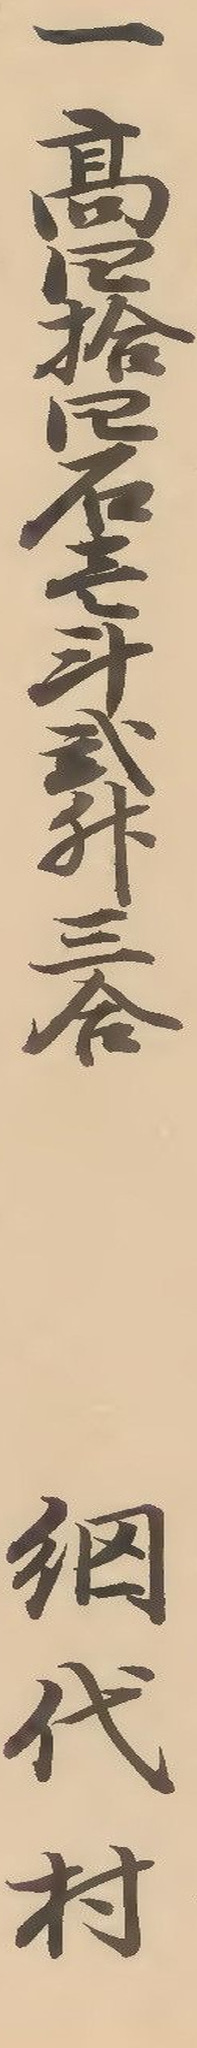一高四拾四石壱斗弐升三合網代村
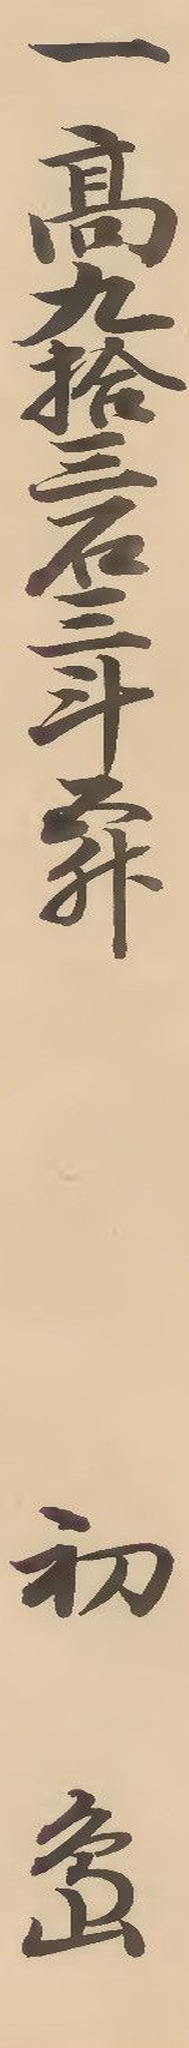一高九拾三石三斗五升初島
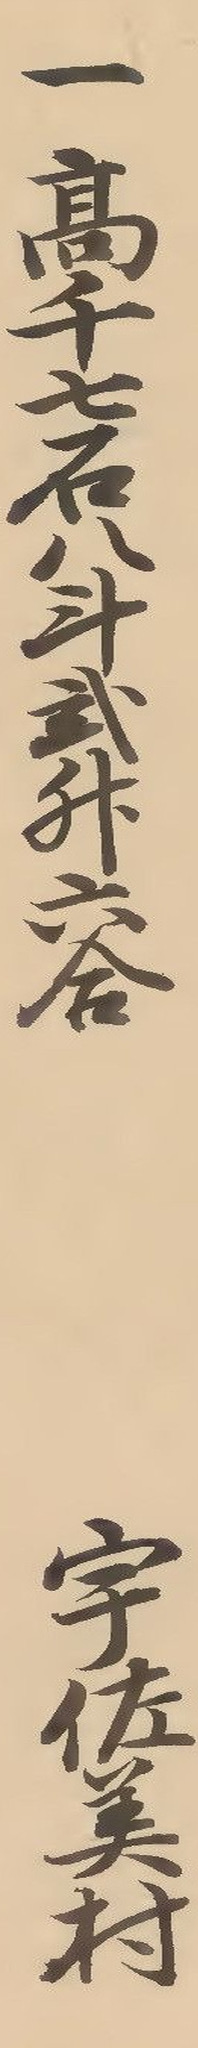一高千七石八斗弐升六合宇佐美村
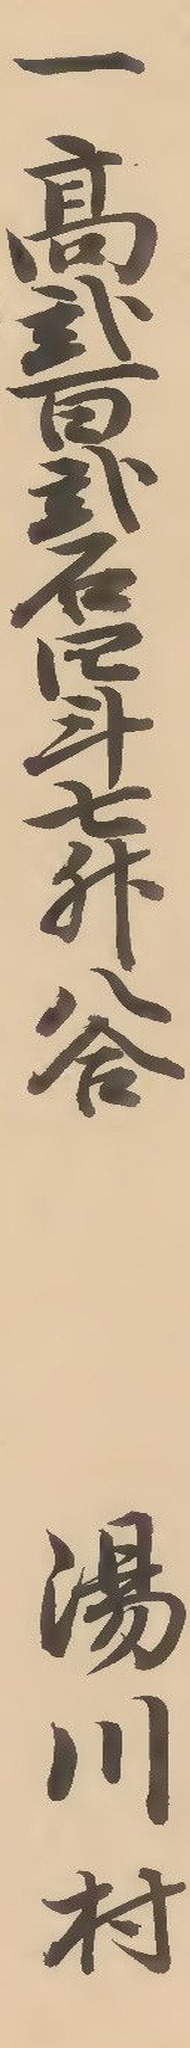一高弐百弐石四斗七升八合湯川村
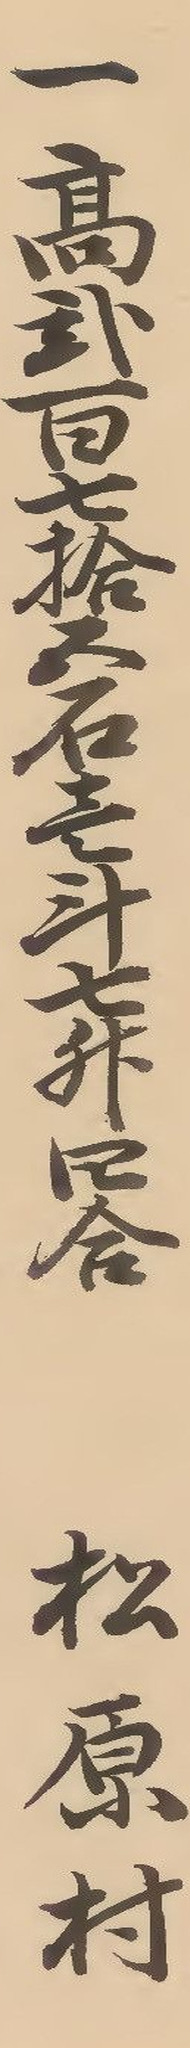一高弐百七拾五石壱斗七升四合松原村
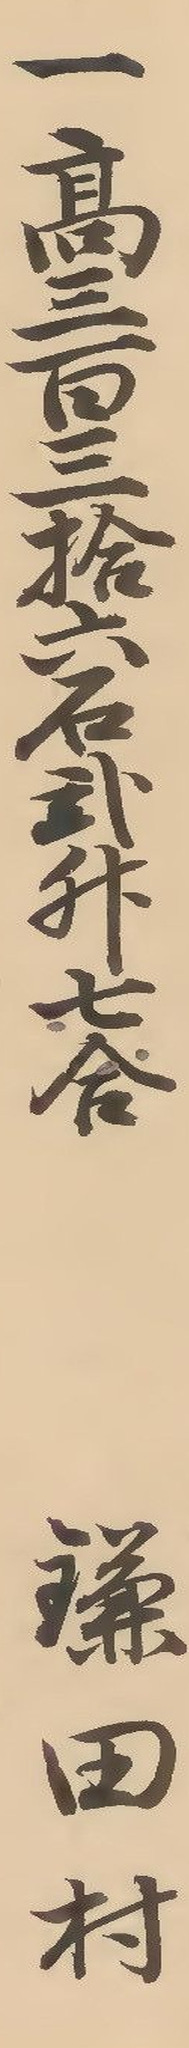一高三百三拾六石弐升七合鎌田村

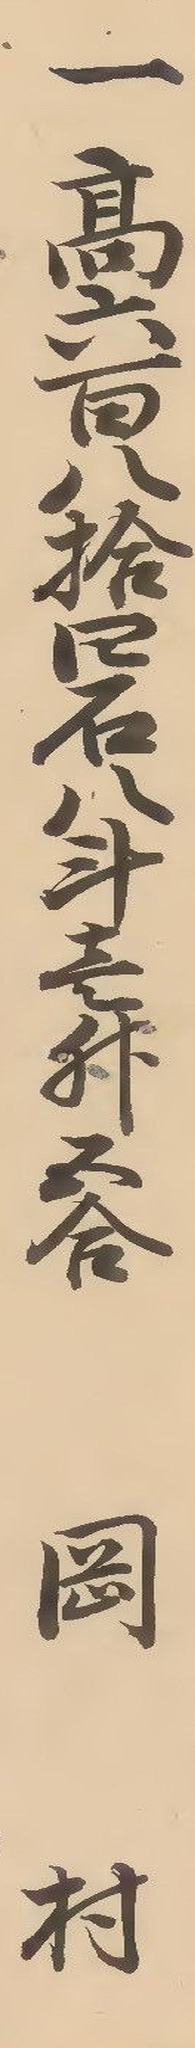一高六百八拾四石八斗壱升五合岡村
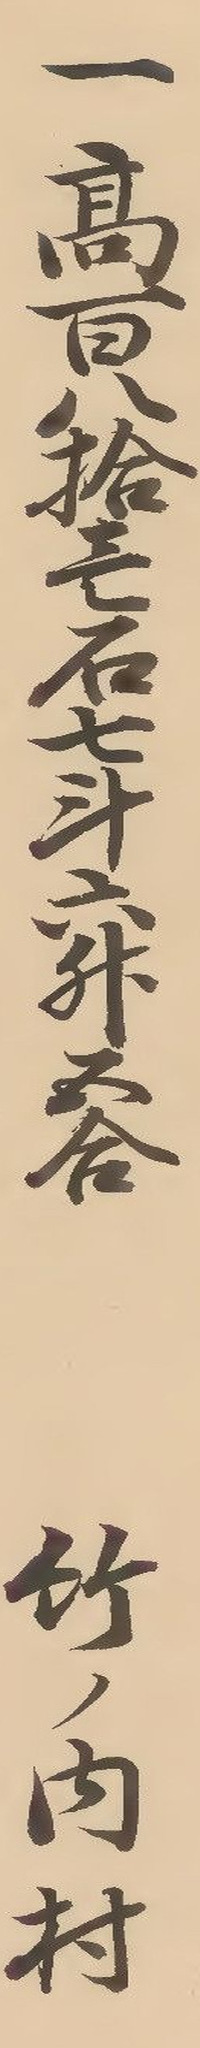一高百八拾壱石七斗六升五合竹ノ内村
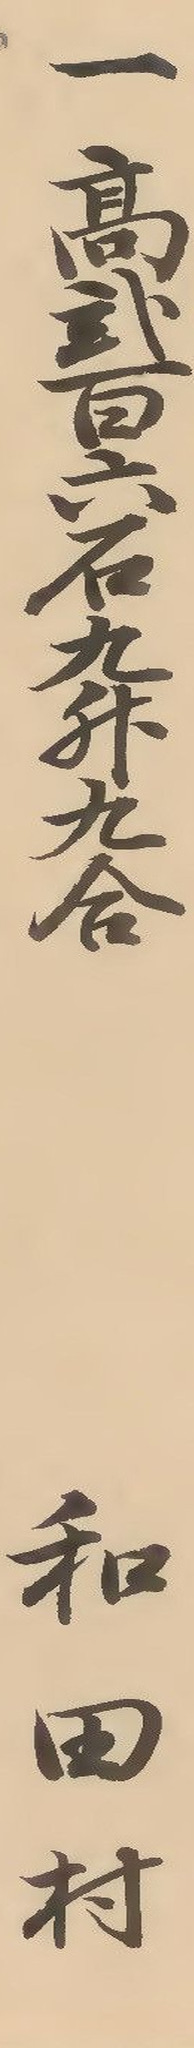一高弐百六石九升九合和田村
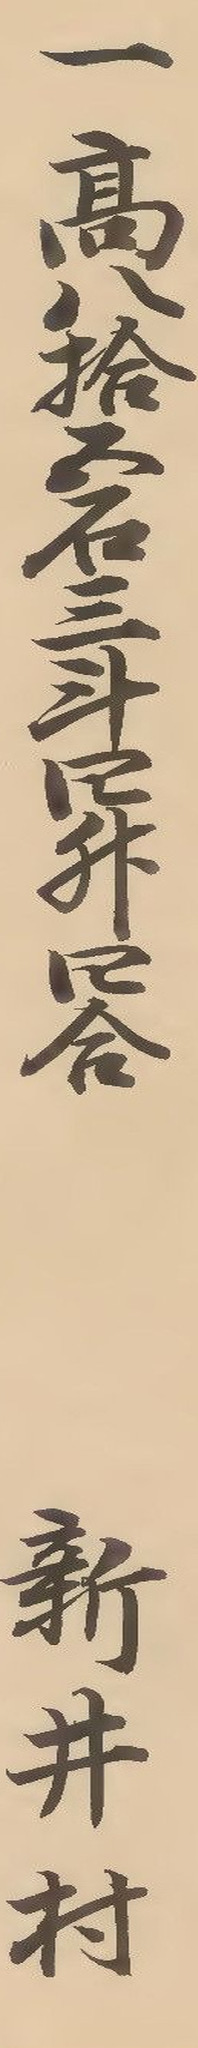一高八拾五石三斗四升四合新井村
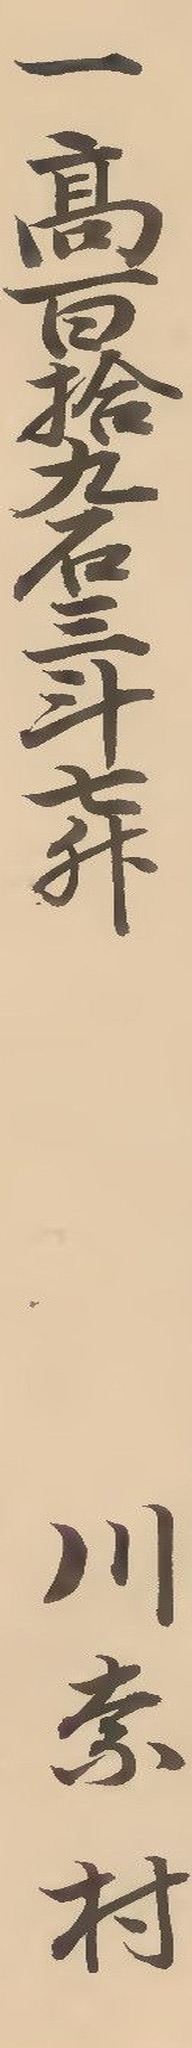一高百拾九石三斗七升川奈村
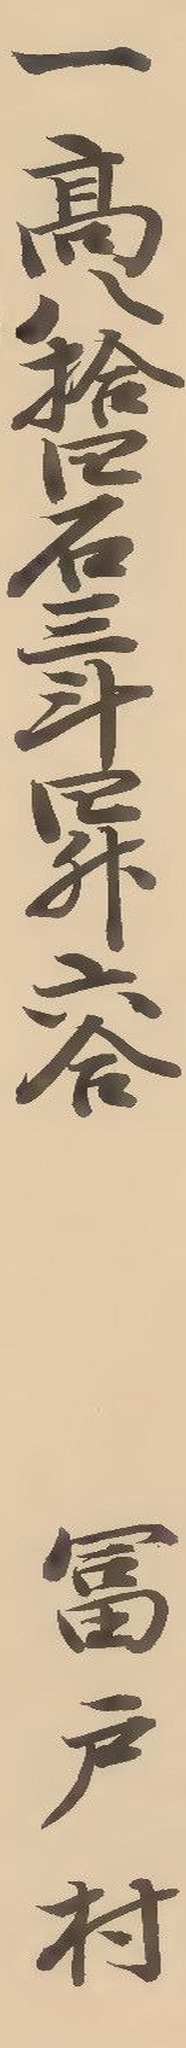一高八拾四石三斗四升六合富戸村
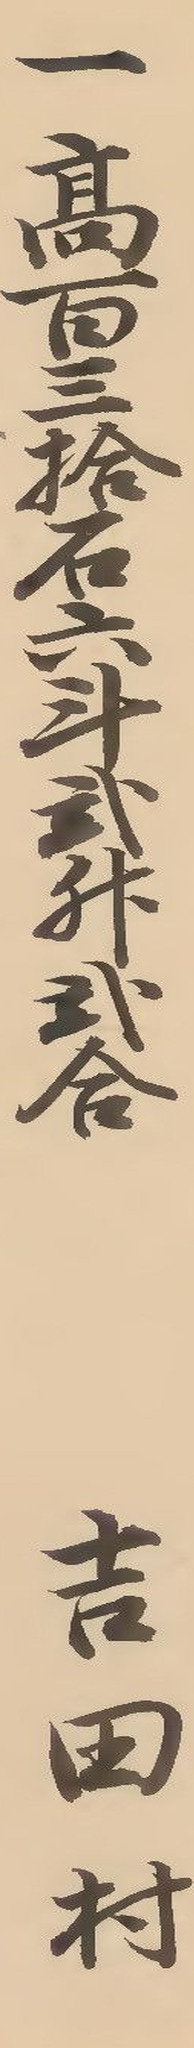一高百三拾石六斗弐升弐合吉田村
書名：伊豆国郷帳
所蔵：国立公文書館 National Archives of Japan
